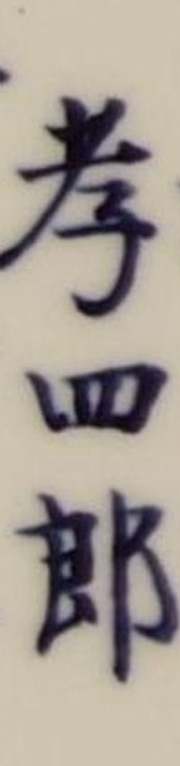孝四郎
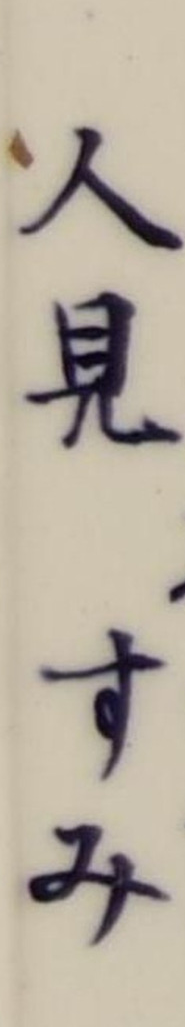人見すみ

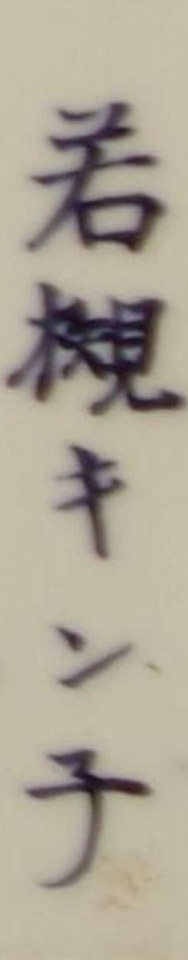若槻キン子
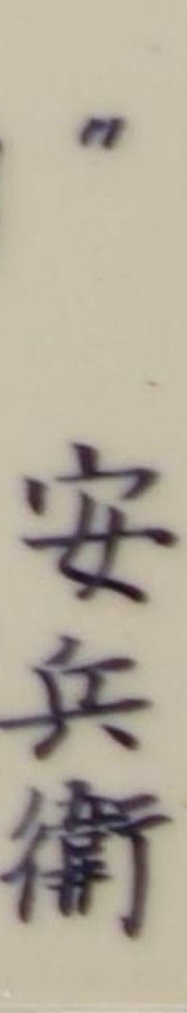安兵衛
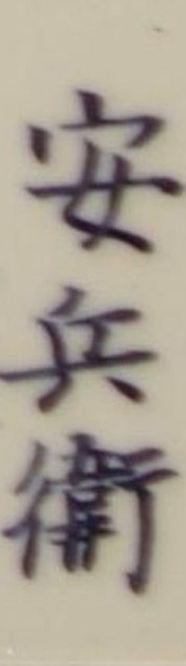安兵衛
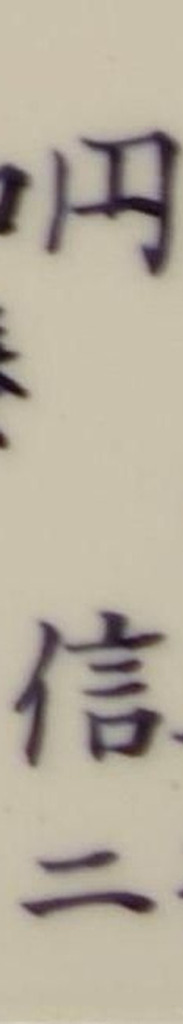円信二
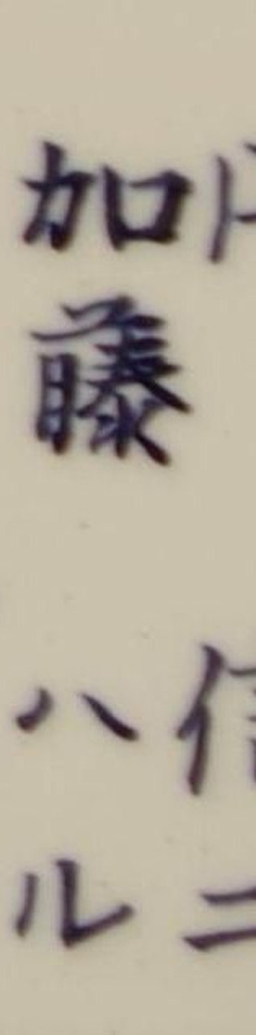加藤ハル
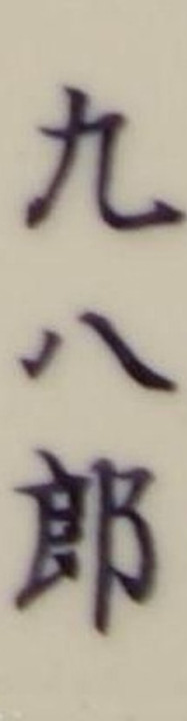九八郎
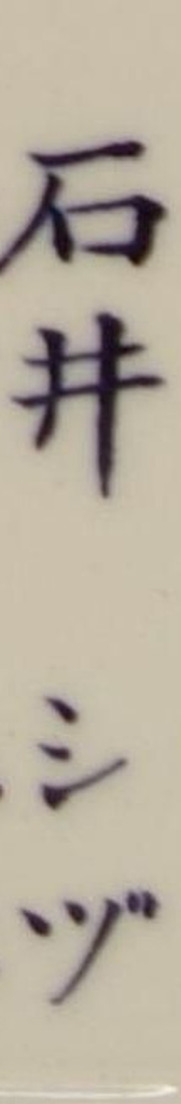石井シヅ
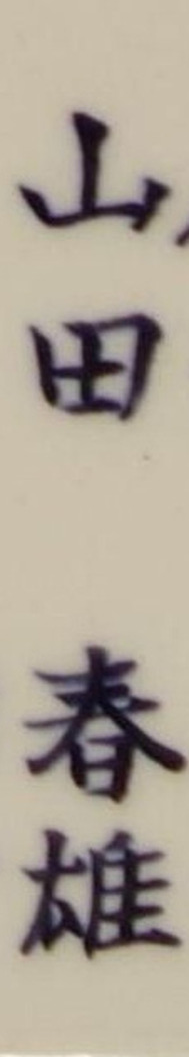山田春雄
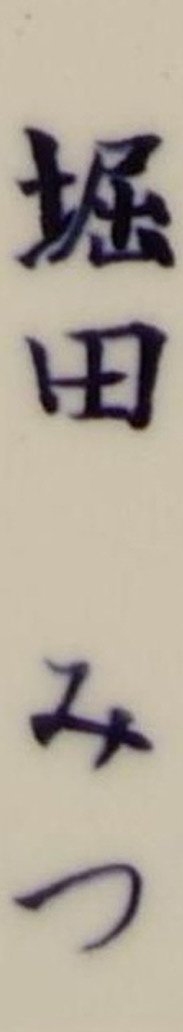堀田みつ
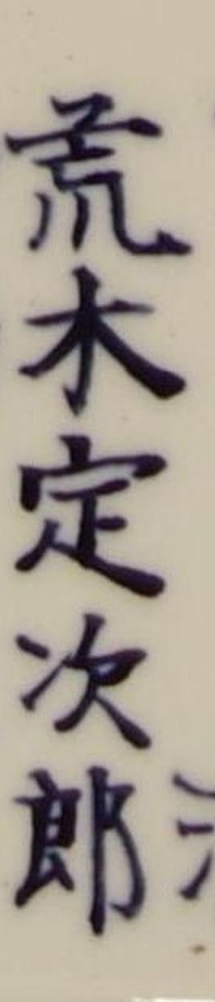荒木定次郎
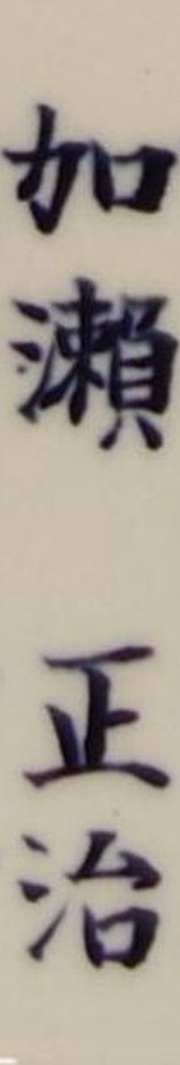加瀬正治
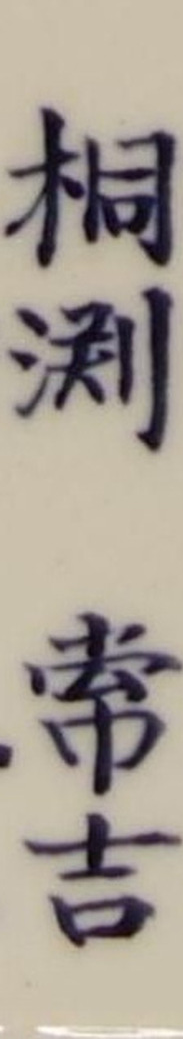桐渕常吉
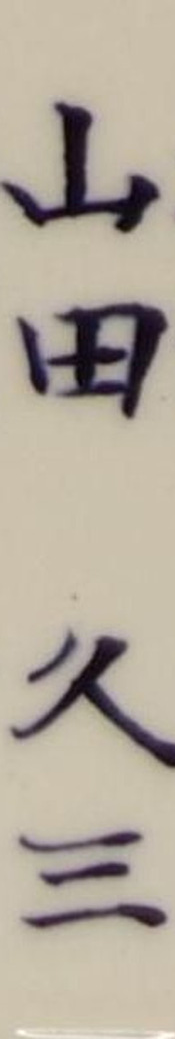山田久三
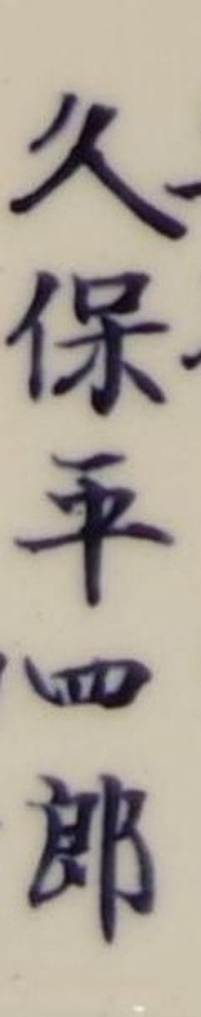久保平四郎
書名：M~S
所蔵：高野山金剛峯寺
